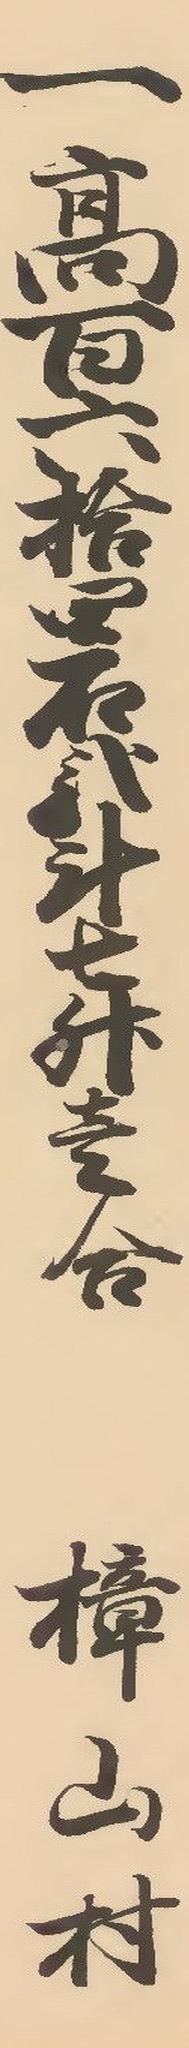一高百六拾四石弐斗七升壱合樟山村
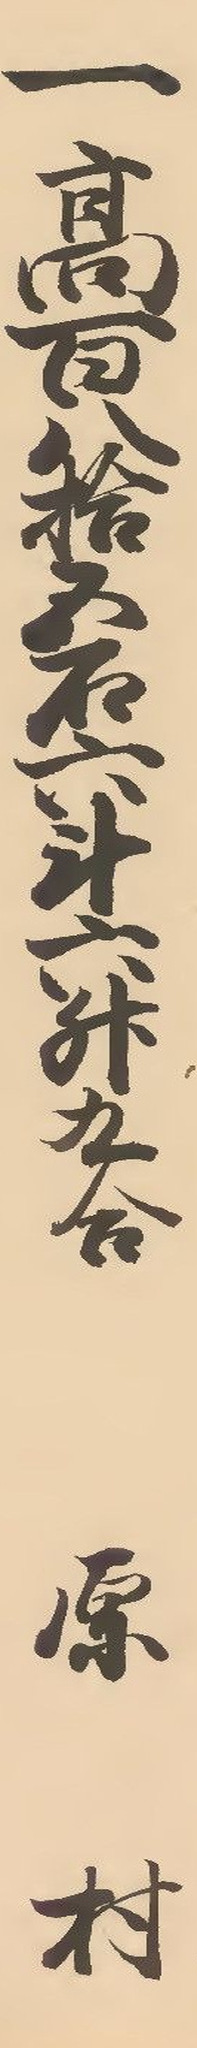一高百八拾五石六斗六升九合原村
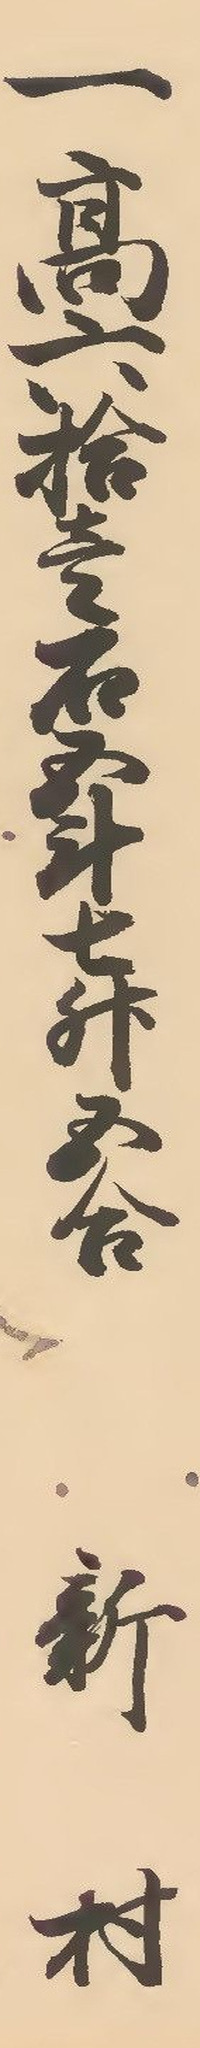一高六拾壱石五斗七升五合新村

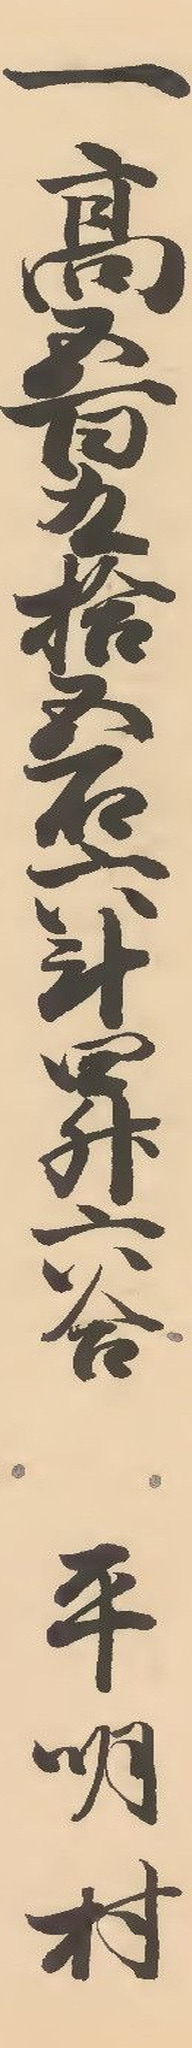一高百五九拾五石六斗四升六合平明村
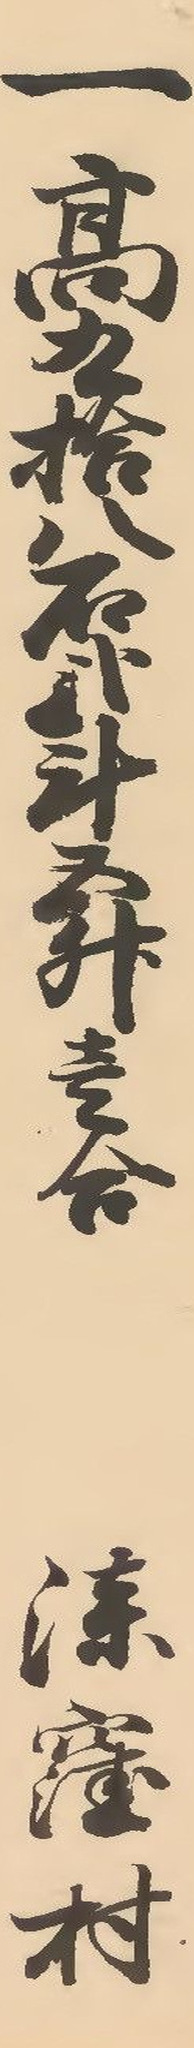一高九拾八石弐斗五升壱合漆窪村
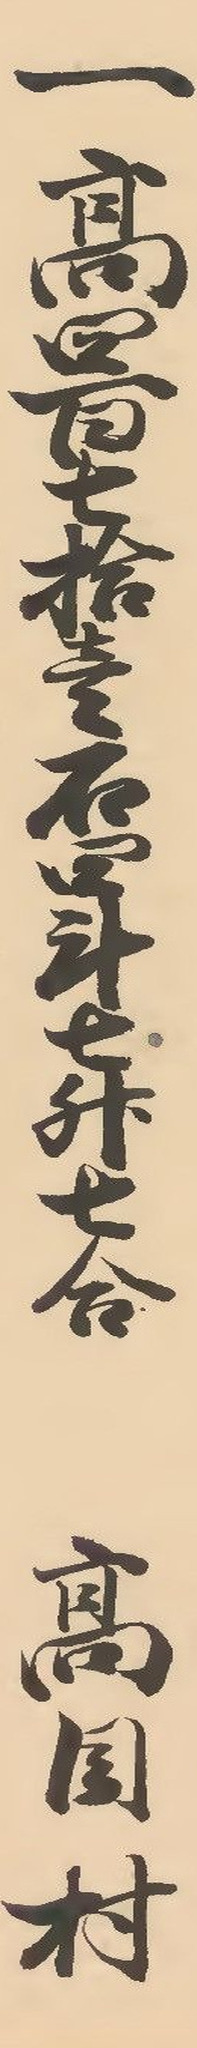一高四百七拾壱石四斗七升七合高目村
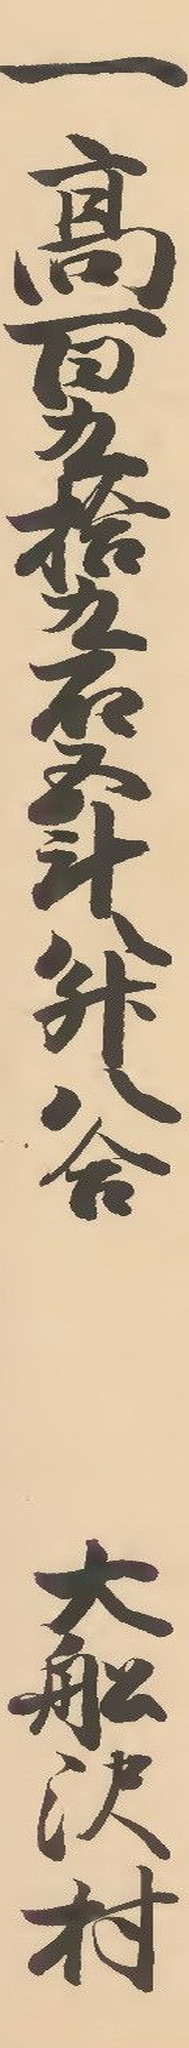一高百九拾九石五斗八升八合大船沢村
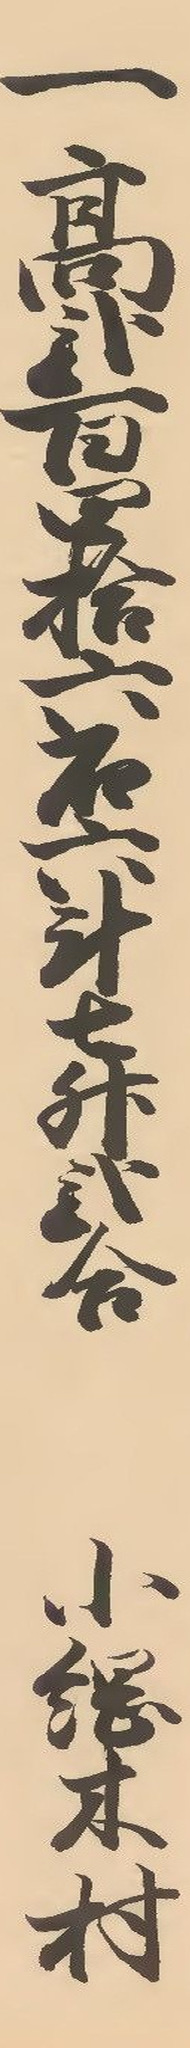一高弐百四拾六石斗六七升弐合小綱木村
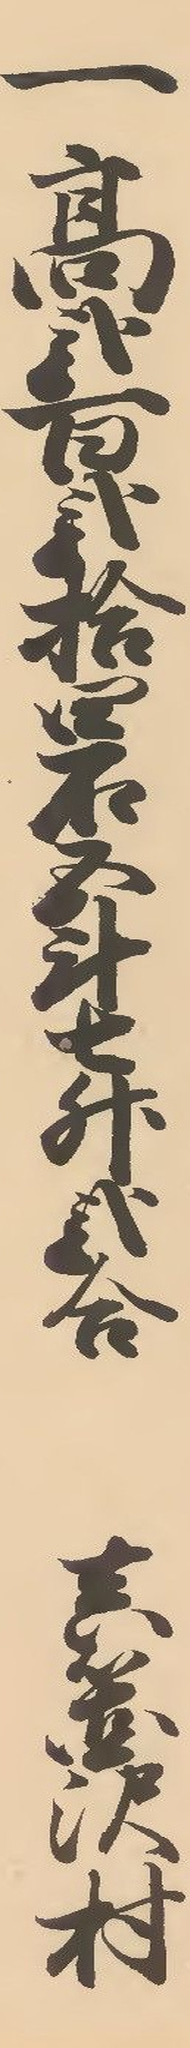一高弐百弐拾四石五斗七升弐合真箇沢村
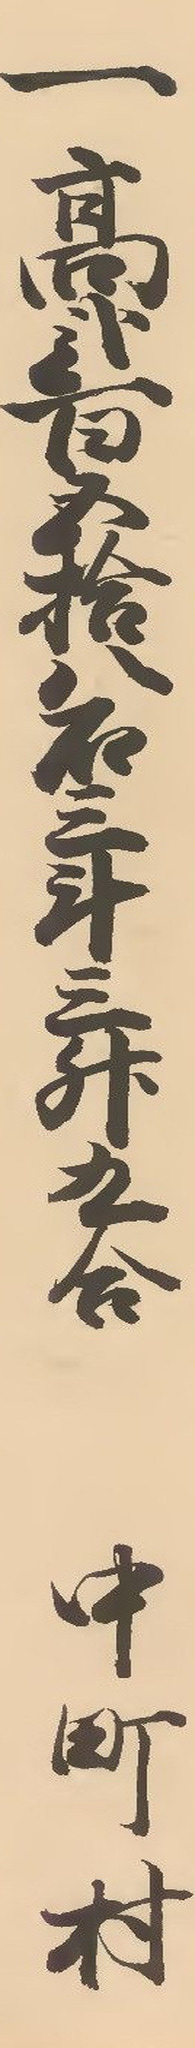一高弐百五拾八石三斗三升九合中町村
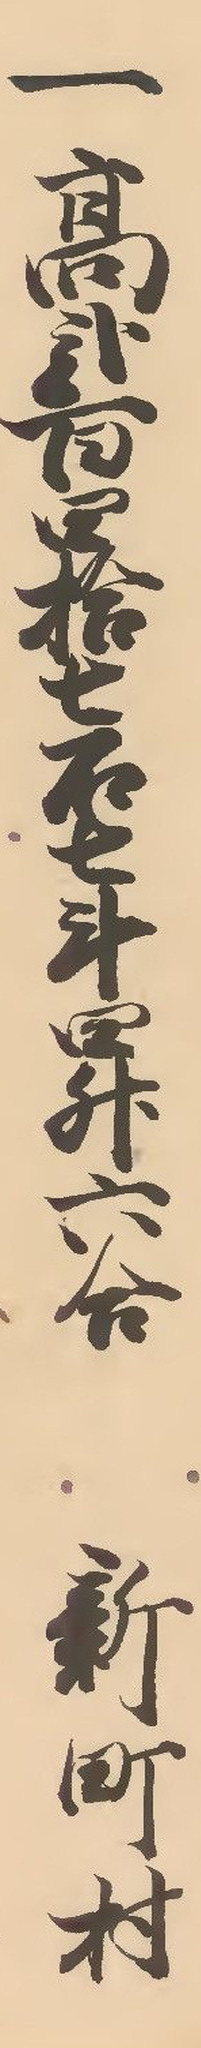一高弐百四拾七石七斗四升六合新町村

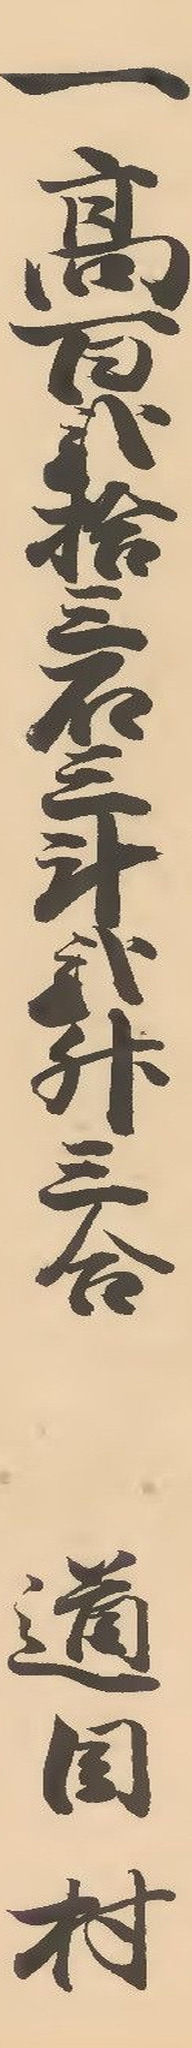一高百弐拾三石三斗弐升三合道目村
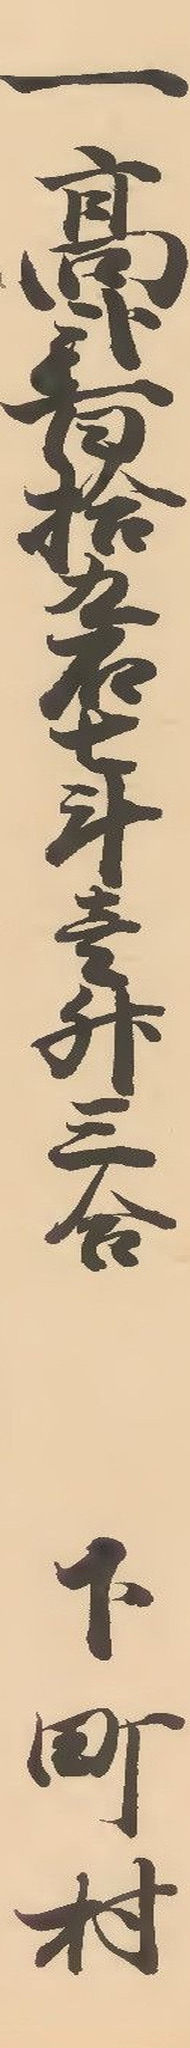一高弐百拾九石七斗壱升三合下町村
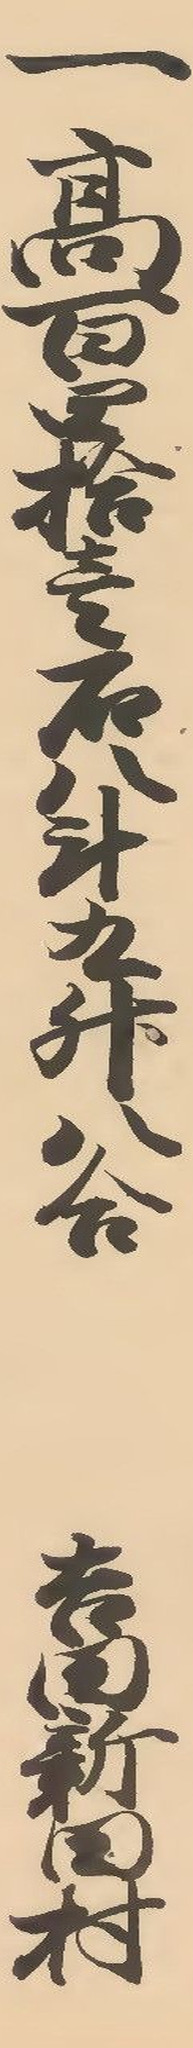一高百四拾壱石八斗ｋ升八合吉田新田村
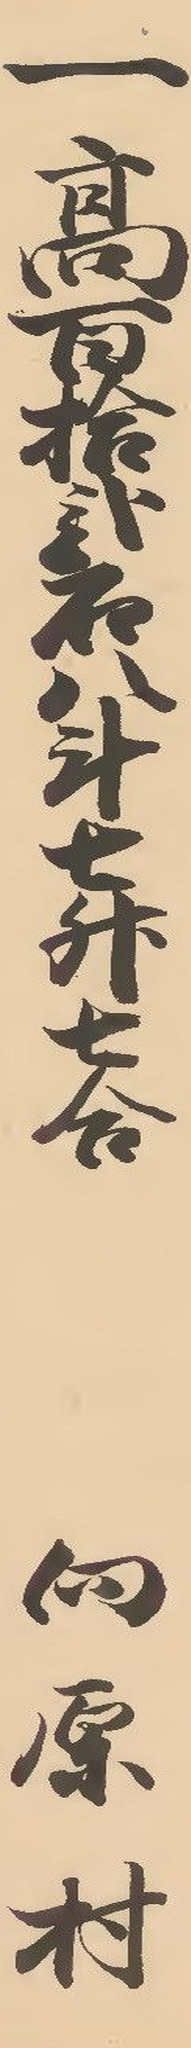一高百拾弐石八斗七升七合向原村
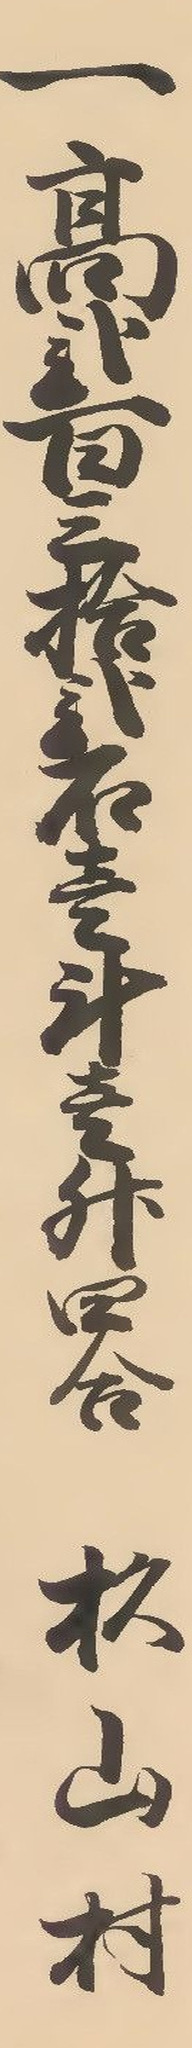一高弐百三拾弐石壱斗壱升四合杉山村
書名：陸奥国郷帳　１
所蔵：国立公文書館 National Archives of Japan
